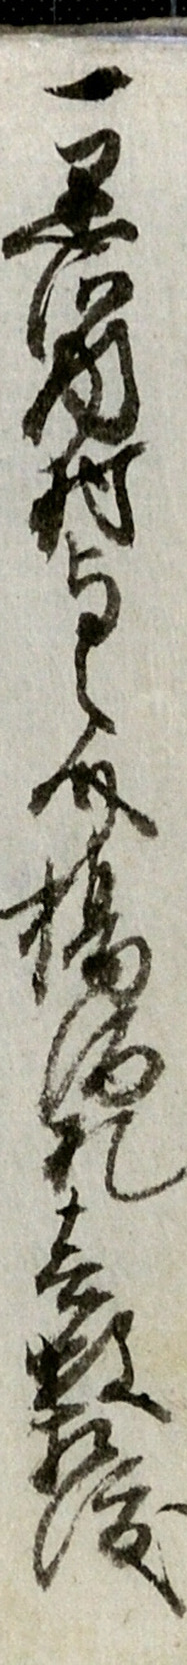一黒河内村与之介揚酒札壱枚相渡
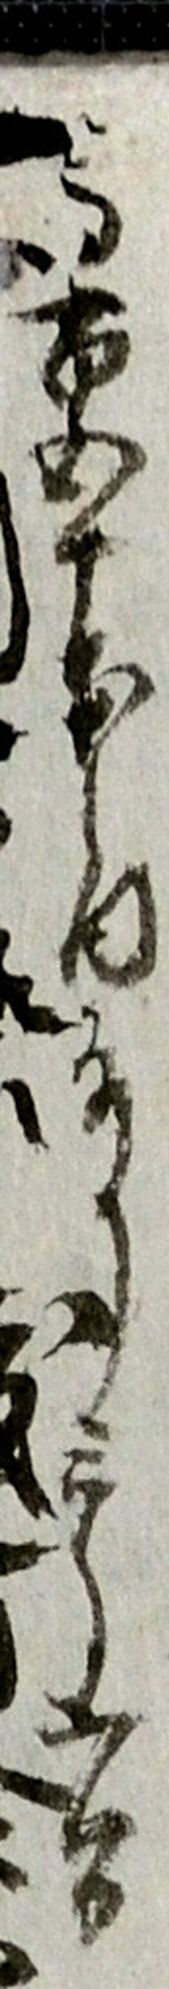高百五十本之内なり三月六日
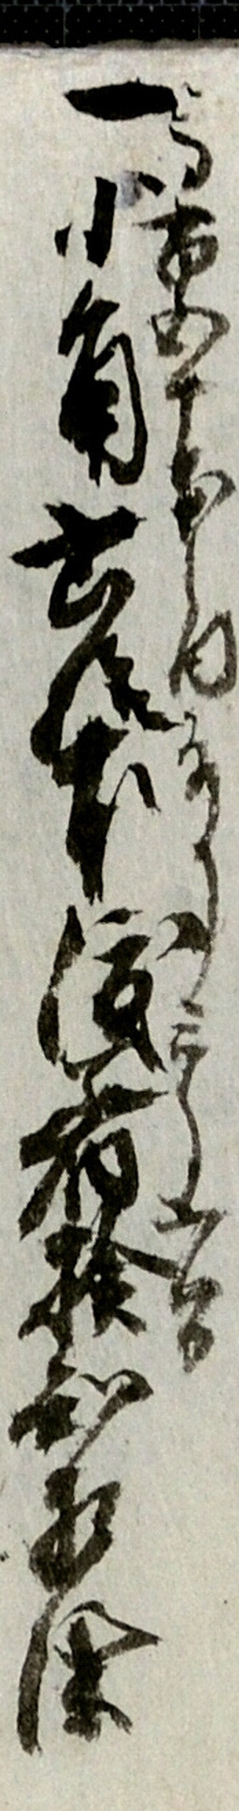一小角六拾本渡着検知相除
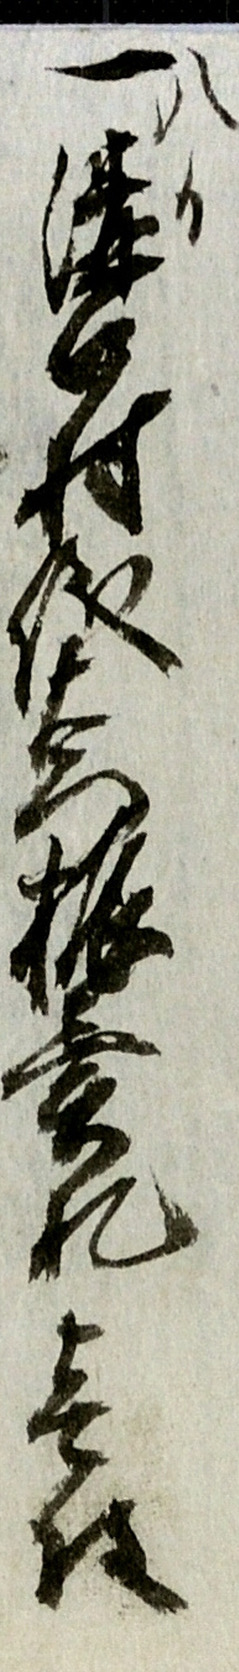一溝口村儀右衛門振売札壱枚
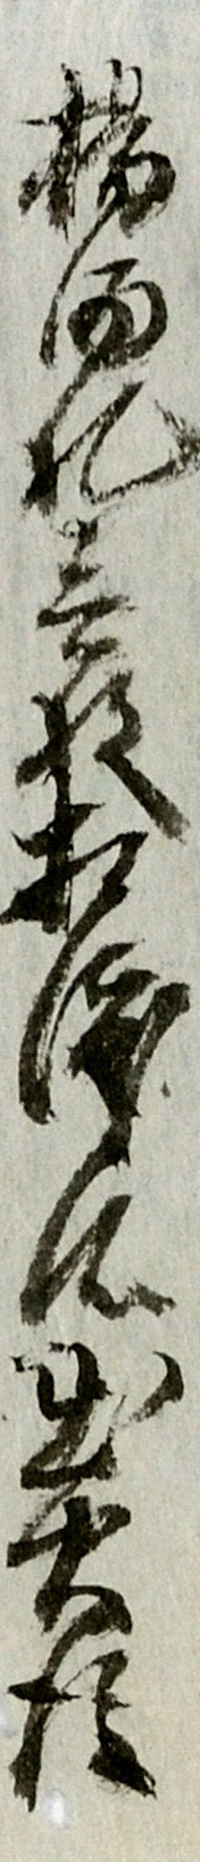揚酒札壱枚相渡候跡出火従
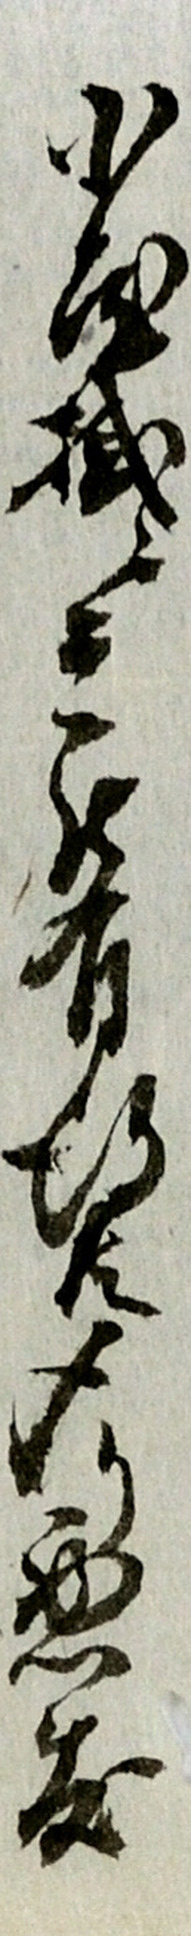小屋掛ニ而罷有候得共〆り悪敷
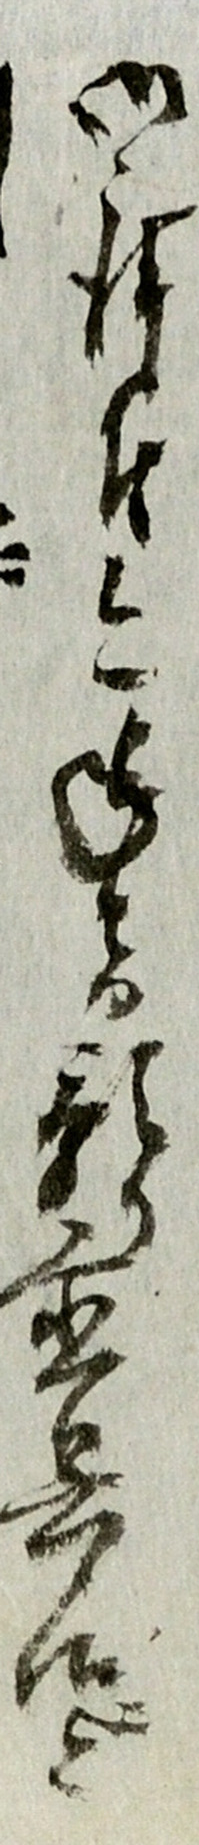御座候付弐付今日預り置呉候様ニと
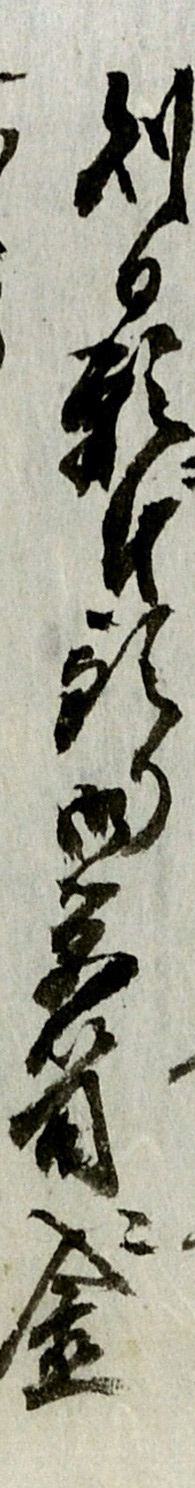則日願ニ付預り御箪笥ニ金
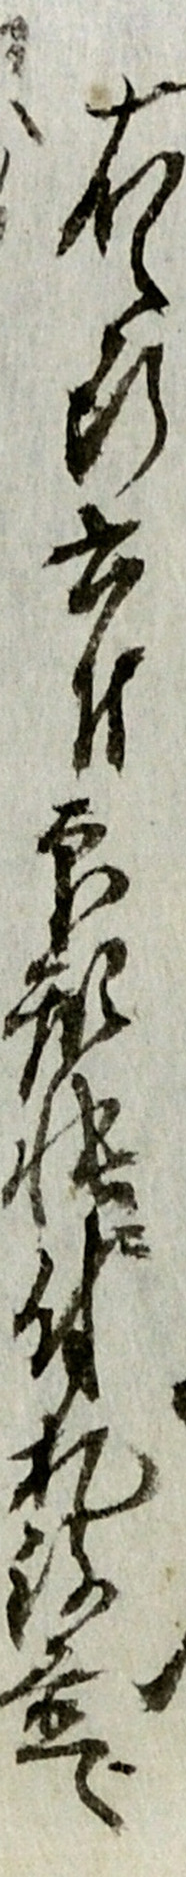右之断書付印形帳ニ付札致置候
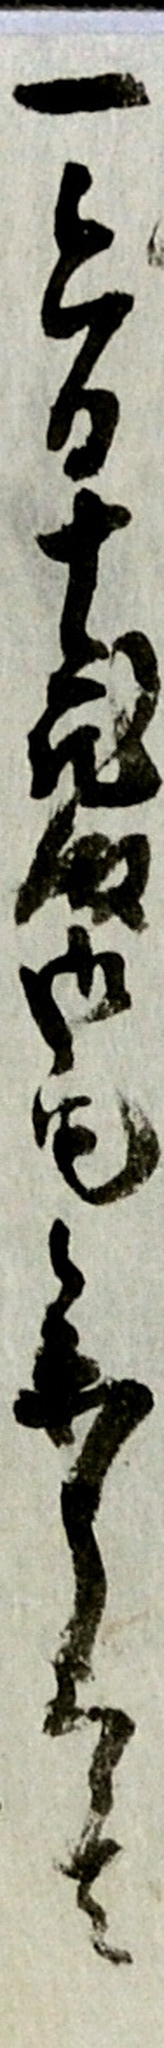一今日十蔵殿御宅被参申上候は
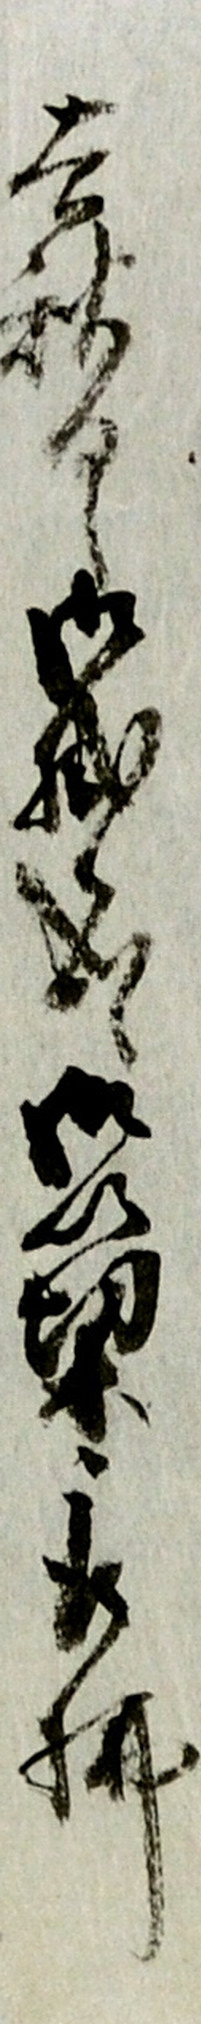去秋日之御掛被成候御築取払
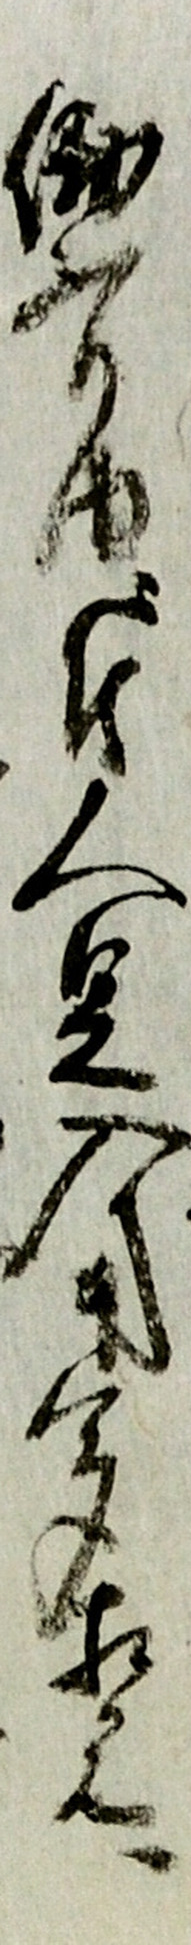働不り由ニ付人足入用多相見へ
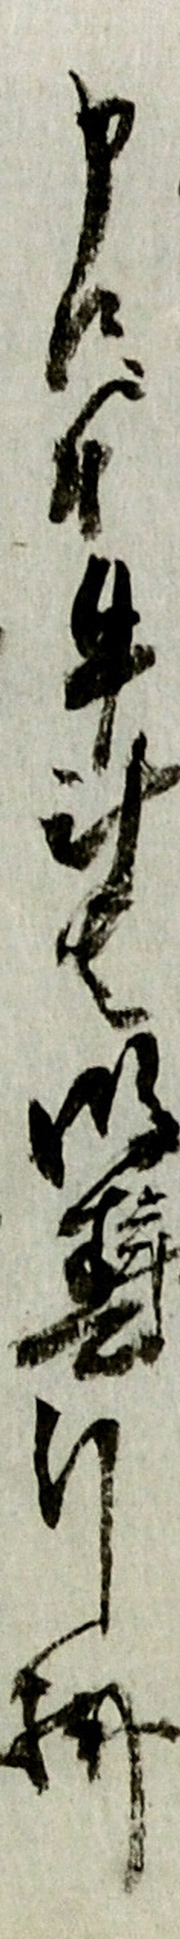申候ニ付牛計は明年春引払
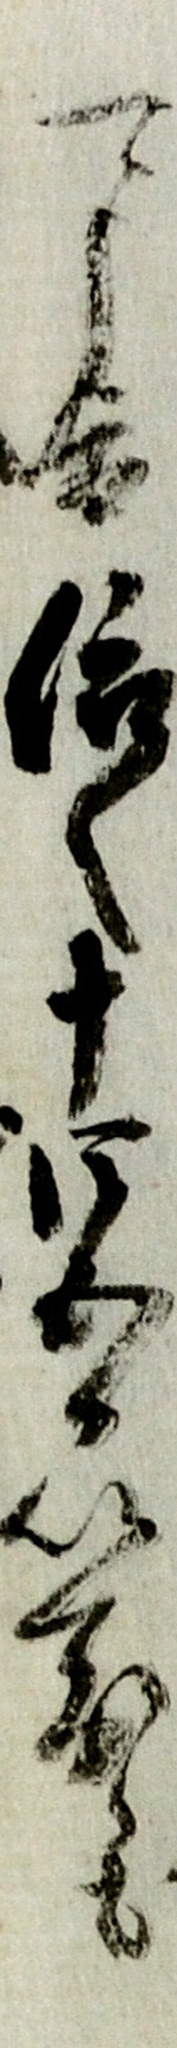可申旨依之十四五日以前ニも
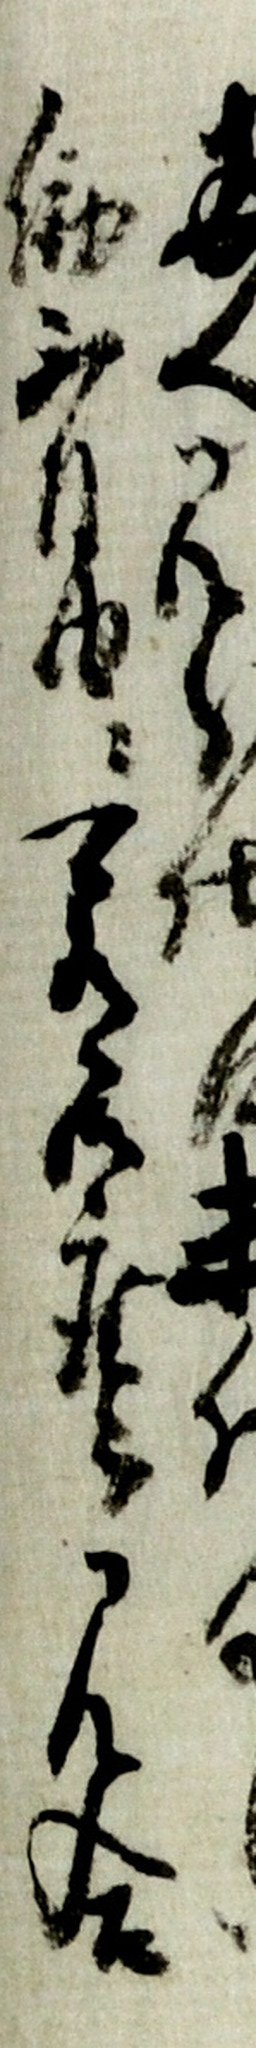働不自由に可有御座候見合

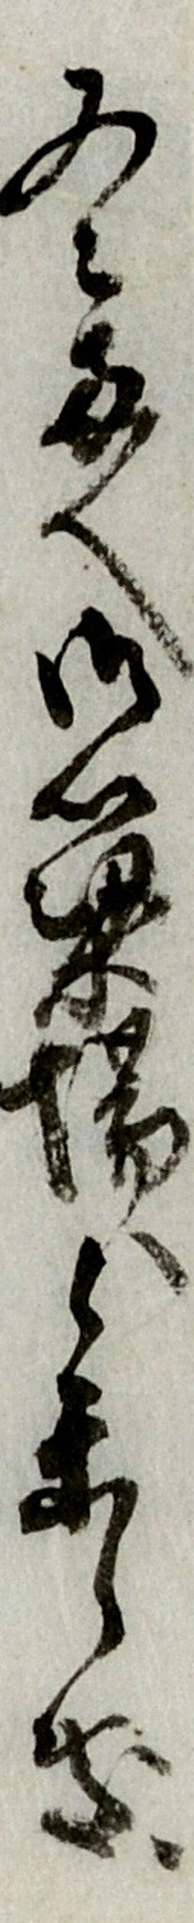又々両人御簗場へ被参候処
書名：分一方諸事御用留帳
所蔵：伊那市立高遠町図書館・合同会社AMANE
